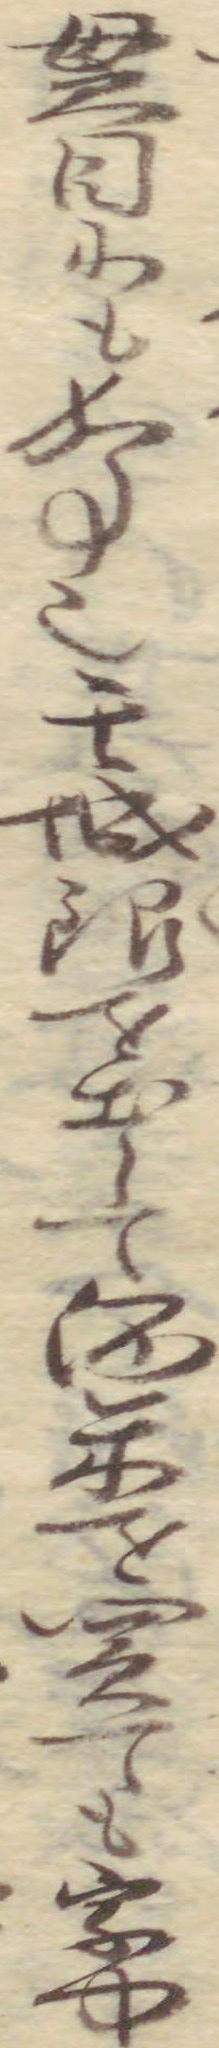貫目にも成事也其城銀を出して酒米を買ても家中
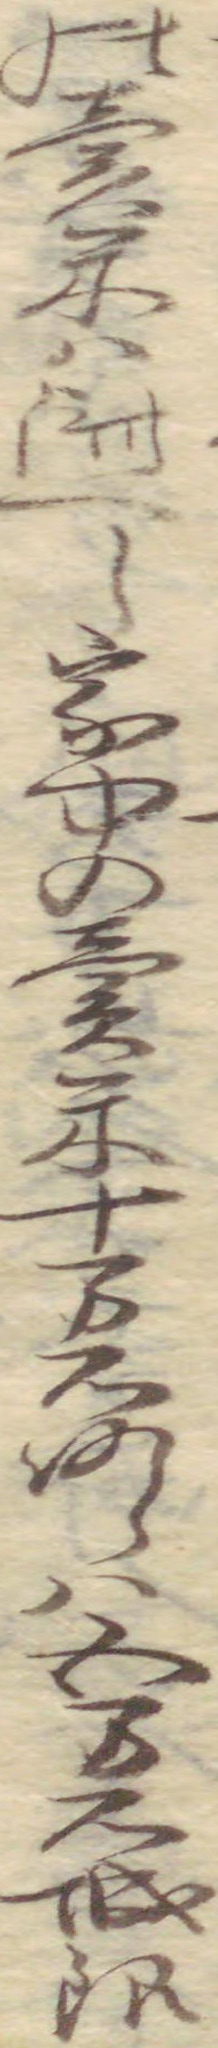の売米は済へし家中の売米十万石あらは五万石城銀
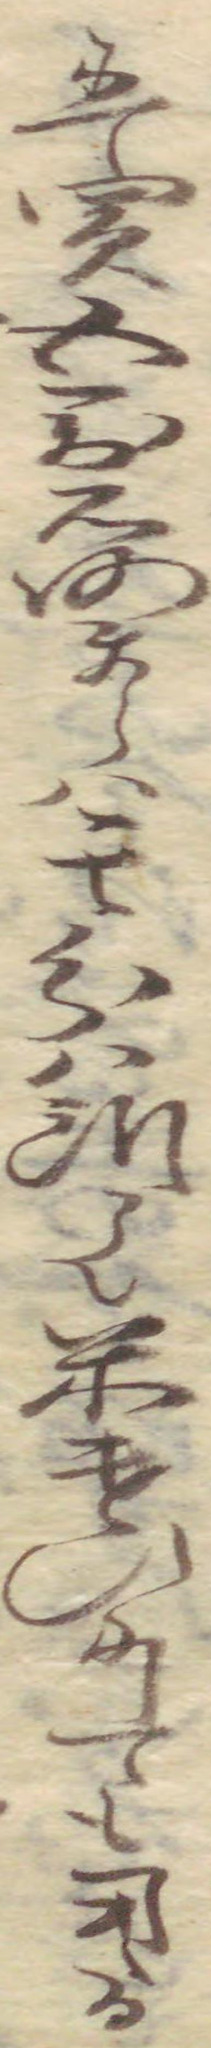にて買五万石あまらは其分は所ニて米遣ひにしても用たる
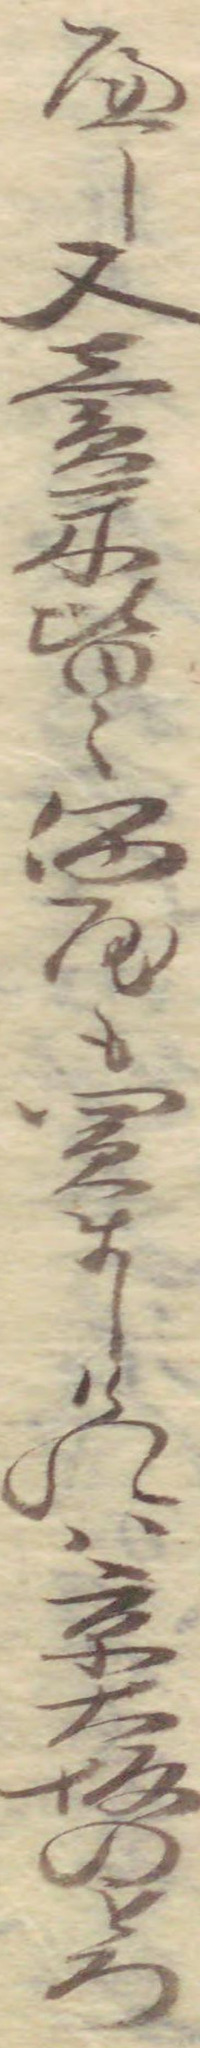へし又売米皆〻酒屋も買ましけれは京大坂のもろ
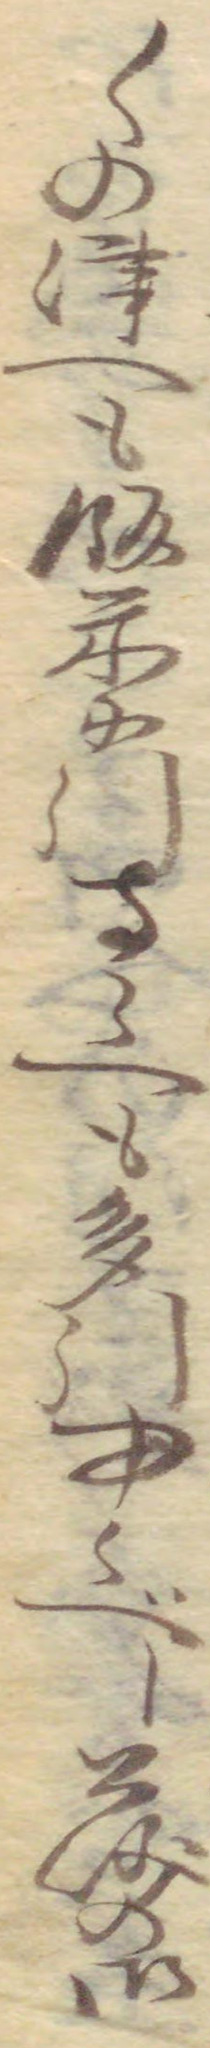〳〵の津へも飯米に引寺〻へも多引ゆくべし公儀の御

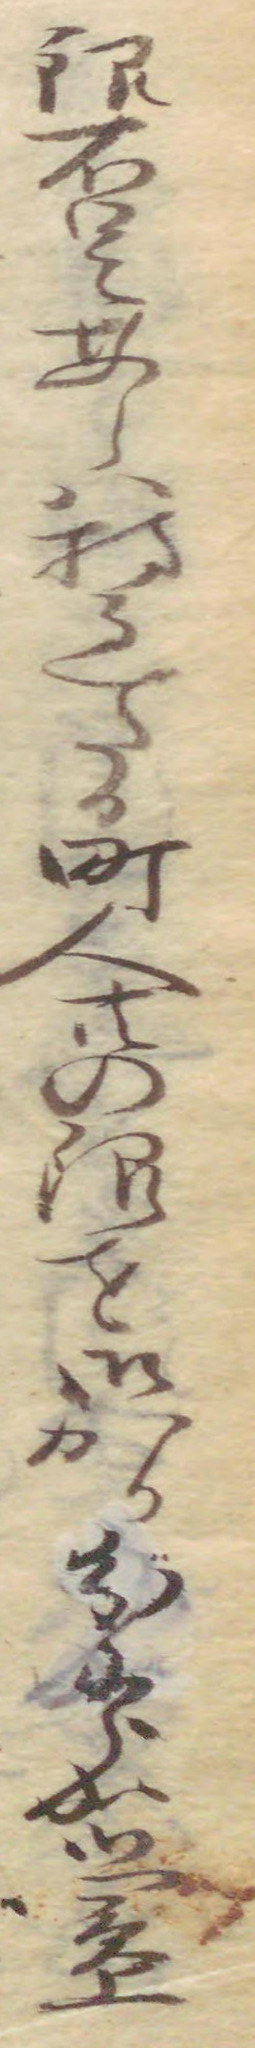銀不足ならは持過たる町人共の銀を御かり分に被成御買上
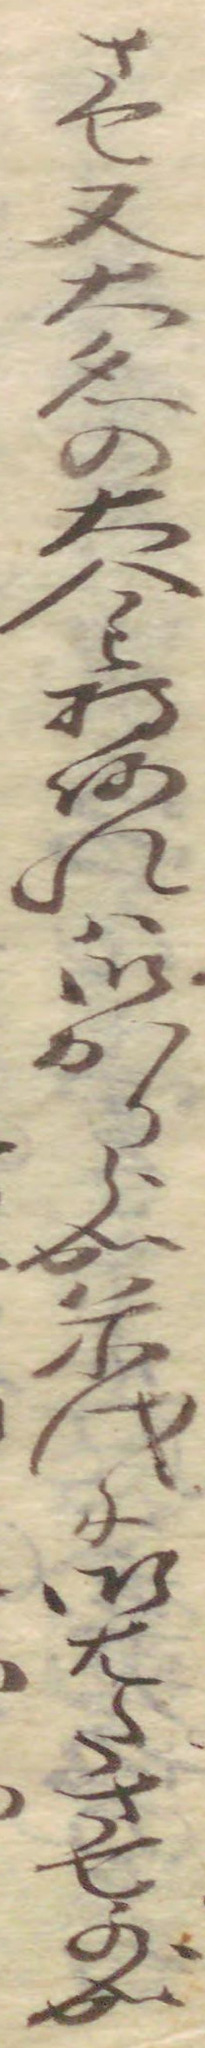させ又大名の大金持あれは御かり被成米代に御はたさせ可被成
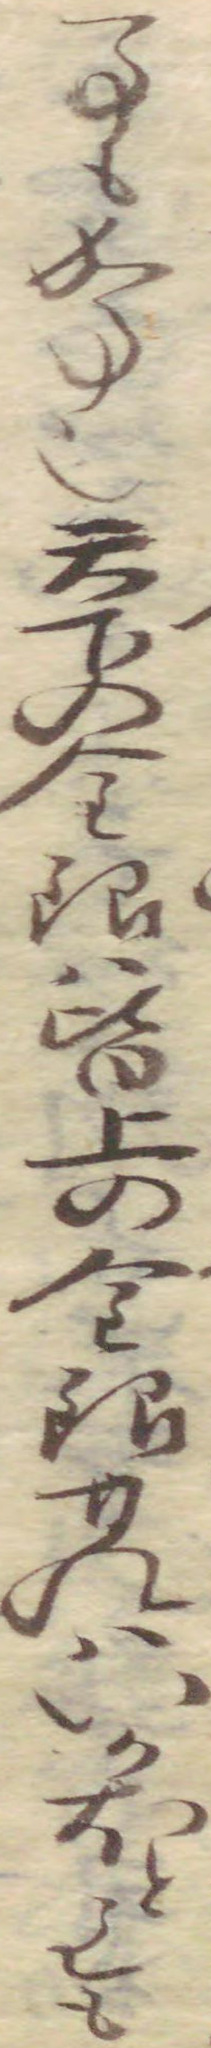事も成事也天下の金銀は皆上の金銀なれはいかほとニても
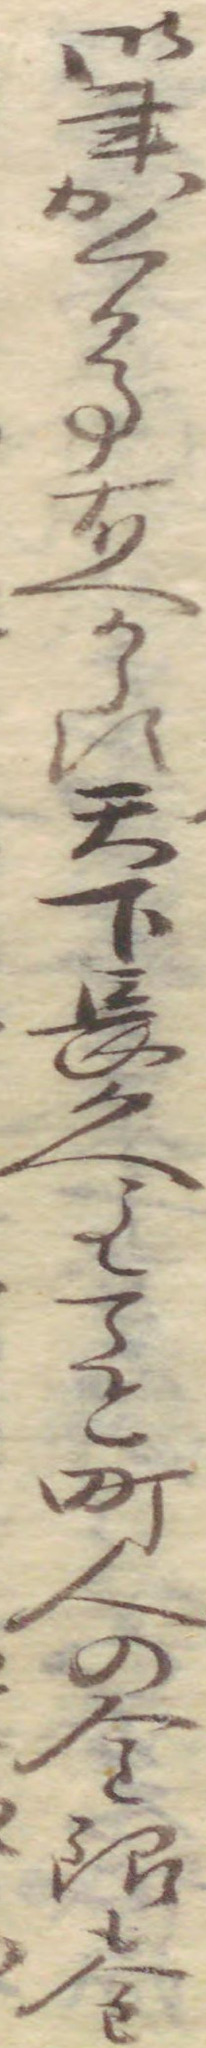御事かくる事有へからす天下長久ニてこそ町人の金銀も金
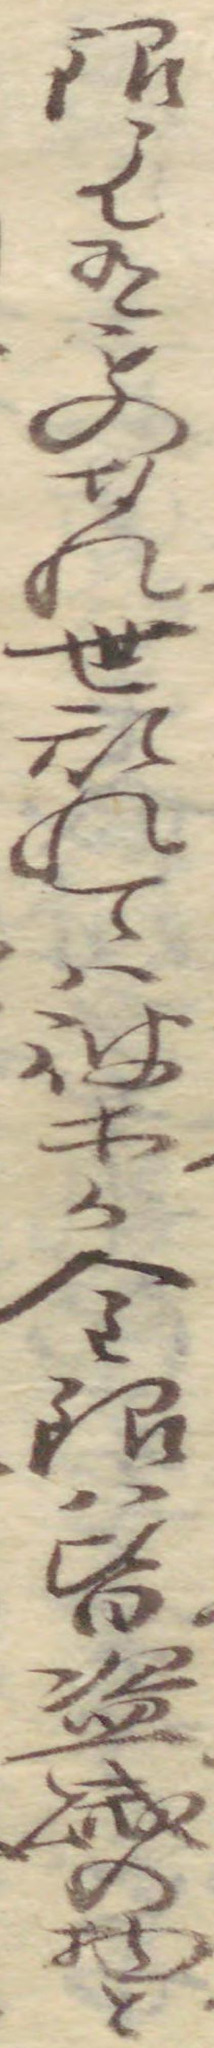銀ニて有ものなれ世乱れては彼等か金銀は皆盗賊の物と
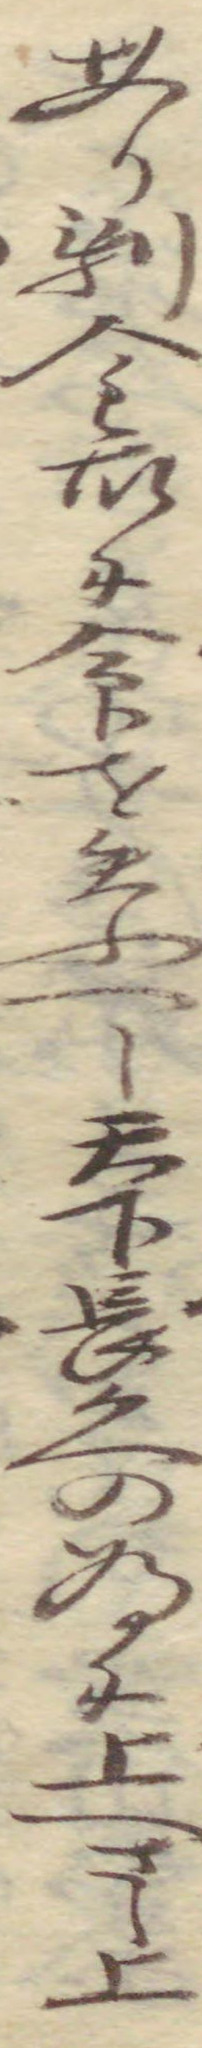なり剰金故に命を失ふへし天下長久の為に上へさし上
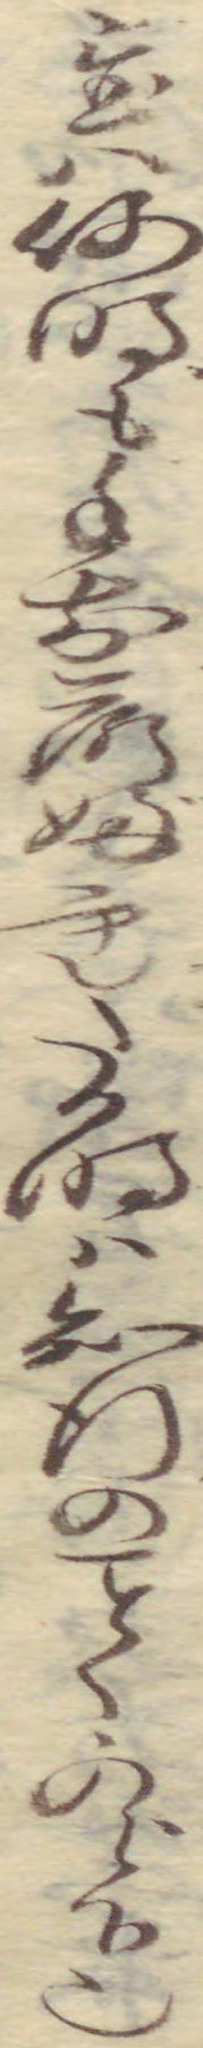置は何時も手前落ぶれたる時は知行のことく可被下也
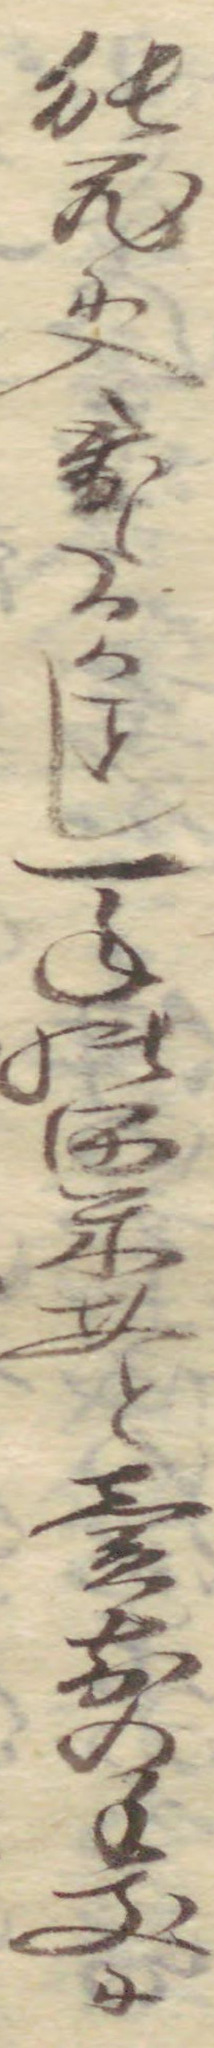能蔵に入置たるかことし一年の酒米なと売前の手支に
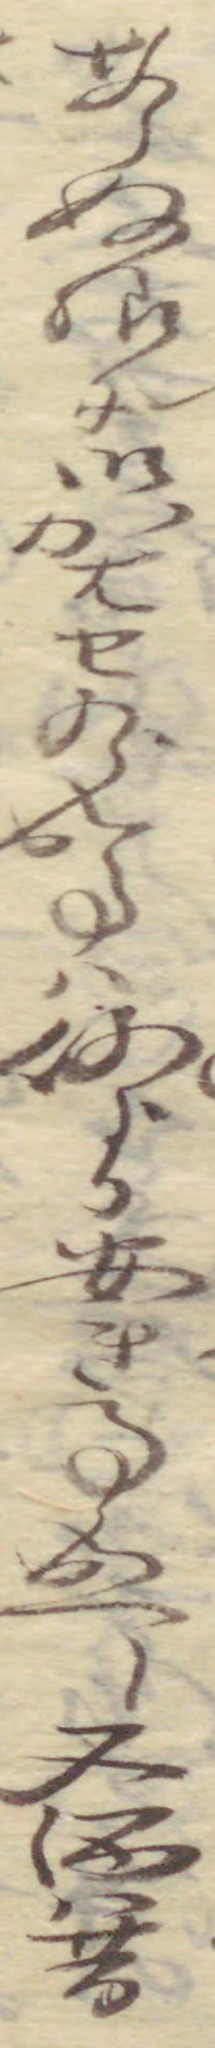ならぬ様に御かはせ可被成事は何より安き事成へし又酒は昔
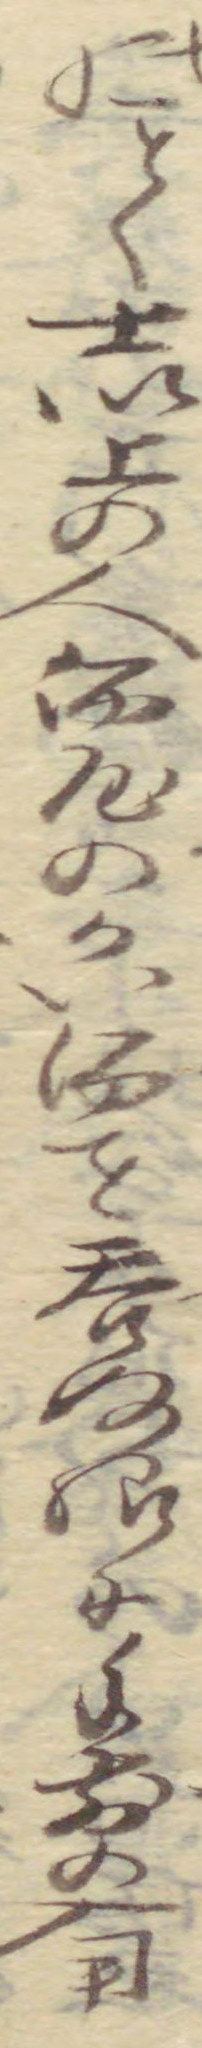のことく士以上の人酒屋のかい酒を呑ぬ様に手前の入用
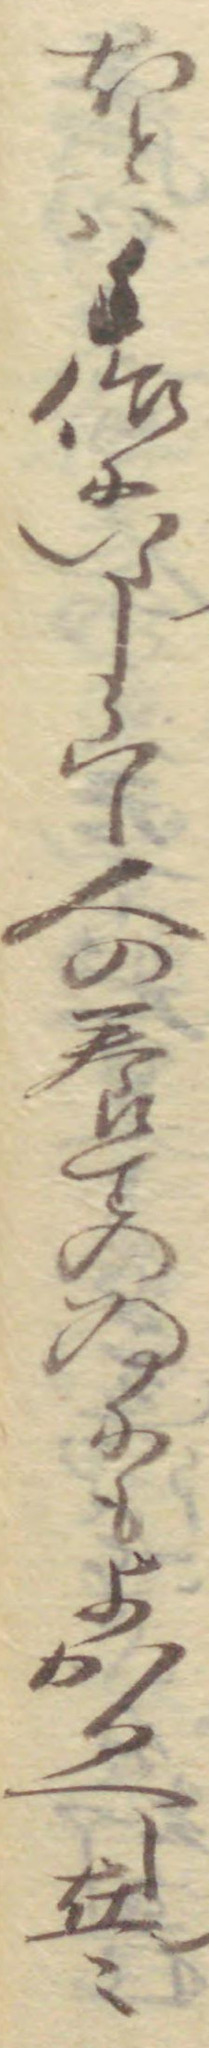ほとは手作にいたし候はゝ人の養生の為にもよかるへし在〻
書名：鶯宿雑記. 巻263-264
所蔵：国立国会図書館 National Diet Library, JAPAN
